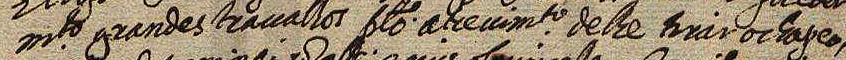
m.to grandes traualhos plō atreuim.to de lhe tirar o chapeo,
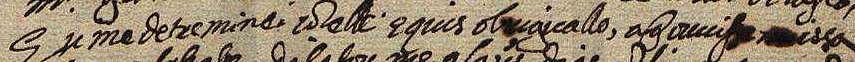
Eu me detreminei cō elle E quis obriguallo, a q̄ ouuisse missa
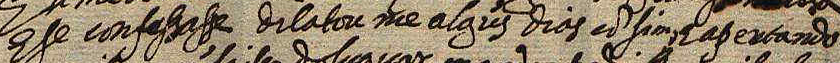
E se confessasse dilatou me algūs dias cō sim, E apertando
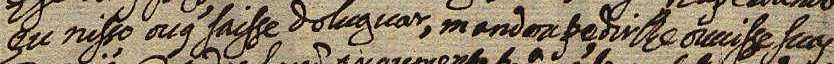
Eu nisso, ou q̄ saisse do luguar, mandou pedirlhe ouuisse suas
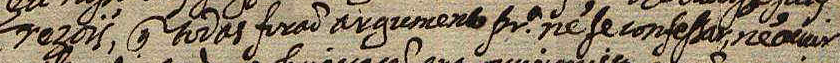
rezoĩs, q̄ todas foraõ argumento pr.a nē se confessar, nē ouuir
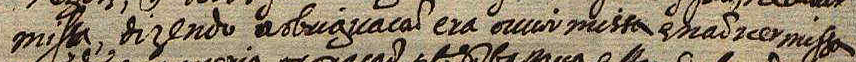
missa, dizendo a obriguaçaõ era ouuir missa E naõ uer missa
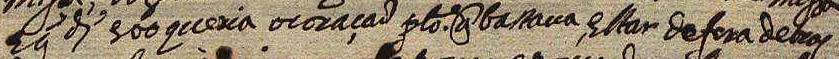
E q̄ ds̄ soo queria o coraçaõ plō. q̄ bastaua, Estar de fora de tras
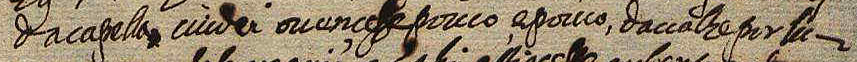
da capella cuidei o uencesse pouco, e pouco, daualhe por lu
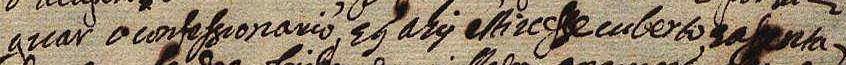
guar o confessionario, E q̄ ahy estiuesse cuberto, e assenta
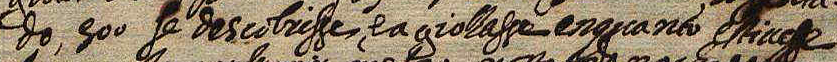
do, soo se descobrisse, e agiolhasse enquanto estiuesse
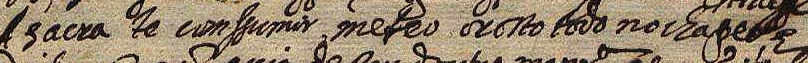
A sacra te comssumir meteo o rosto todo no chapeo, E
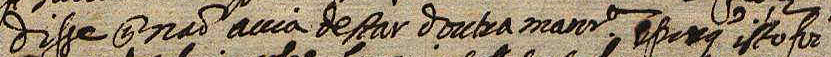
disse q̄ naõ auia destar doutra manr.a e porq̄ isto foi
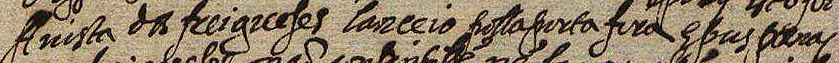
A uista dos freigueses lanceio polla porta fora E pus pœnas
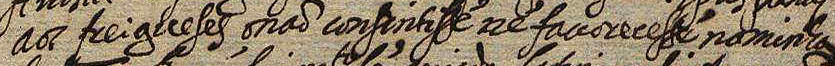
aos freigueses o naõ consintissē nē fauorecessē na minha
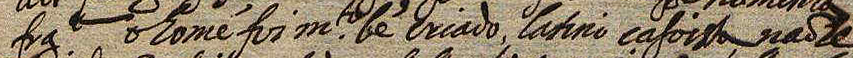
frg.a o homē foi m.to bē criado, latino e casoista, naõ he
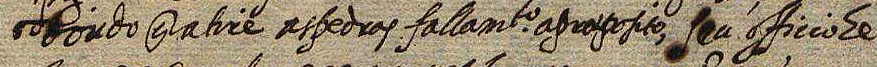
o doudo q̄ atire as pedras falla mt.o a proposito, seu officio he
